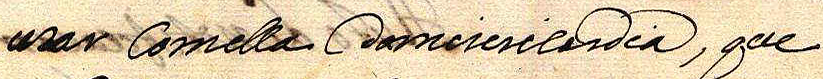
uzar com ella da mizericordia, que
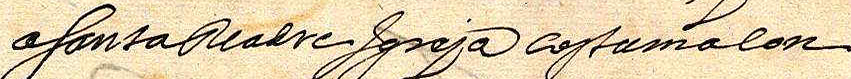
a santa Madre Jgreja costuma con
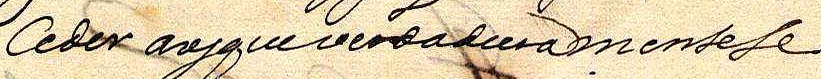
Ceder aos que verdadeiramente se
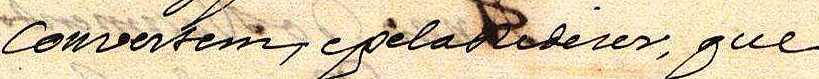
convertem, e pela Re dizer, que
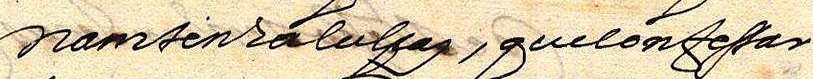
nam tinha culpas, que confessar
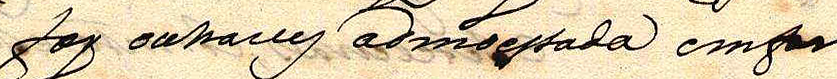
foy outra ues admoestada em for
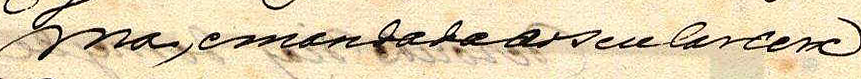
ma, e mandada ao seu carcere
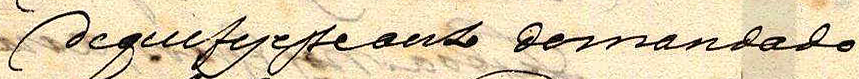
de que fisesse auto de mandado
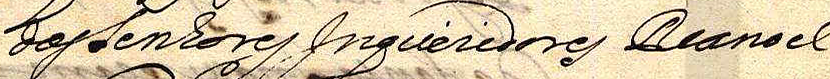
dos senhores Jnquizidores Manoel
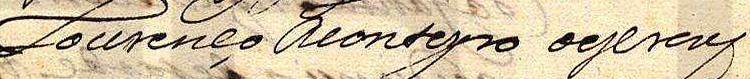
Lourenço Monteyro o escreuj
